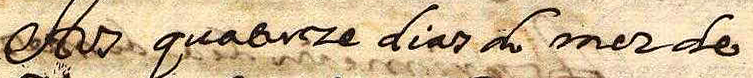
Aos quatorze dias do mez de
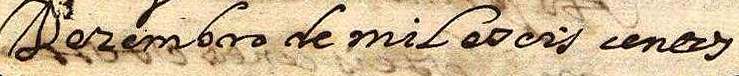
Dezembro de mil e seiscentos
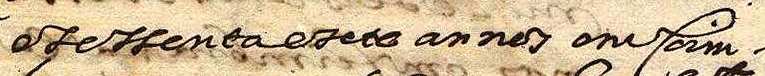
e sessenta e sete annos em Coim
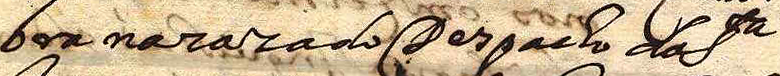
bra na caza do Despacho da Sta
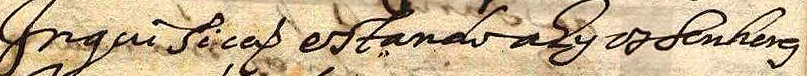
Jnquisiçaõ estando ahy os Senhores
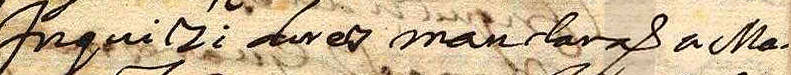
Jnquizidores mandaraõ a Ma
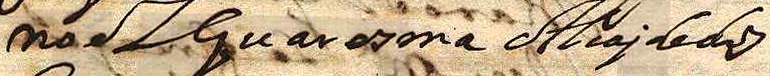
noeL Quaresma Alcajde dos
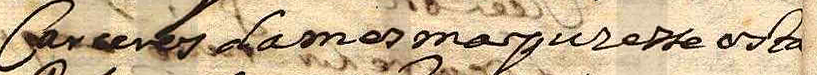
Carceres da mesma puzesse esta
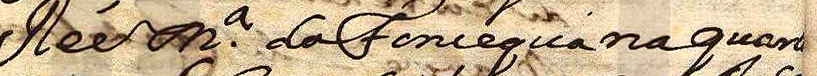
Ree M.a da Foncequa na quart
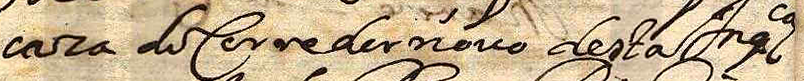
caza do Corredor nouo desta Jnq.ça
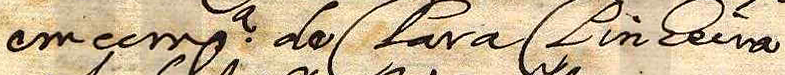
em comp.a de Clara Pinheira
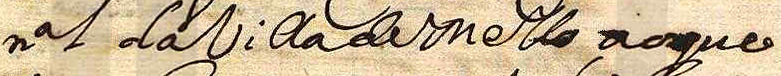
nal da Uilla de Mello ao que
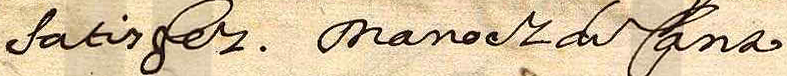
Satisfez. Manoel do Canto
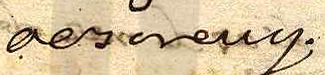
o escreuy.
